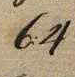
64
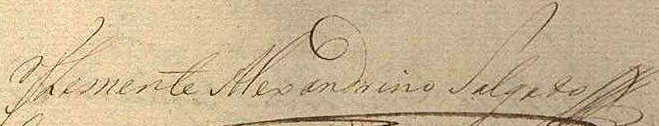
Clemente Alexandrino Salgado
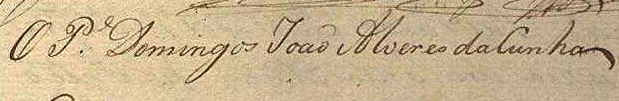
O P.e Domingos Ioaõ Alveres da Cunha
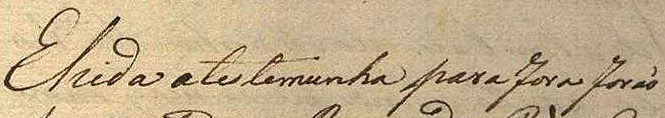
E hida a testemunha para fora foraõ
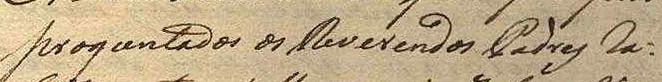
proguntados os Reverendos Padres Ra
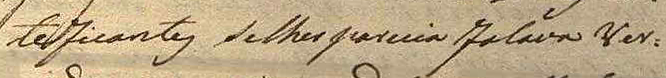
teficantes se lhes parecia falava Ver
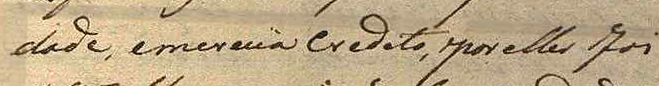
dade, e merecia credito, por elles foi
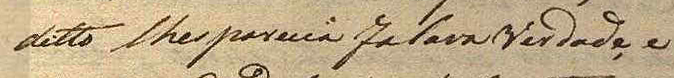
ditto lhes parecia falava verdade, e
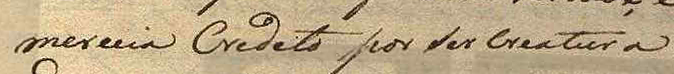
merecia Credito por ser creatura
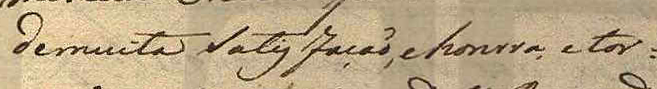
de muita satisfaçaõ, e honrra, e tor
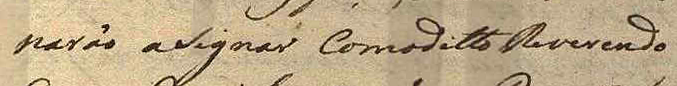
naraõ asignar com o ditto Reverendo
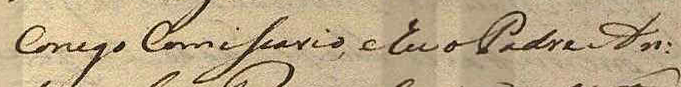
Conego Comissario, e Eu o Padre An
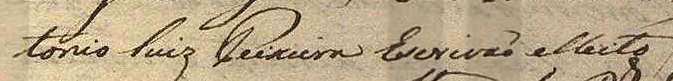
tonio luiz Teixeira Escrivaõ elleito
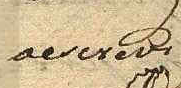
o escrevi
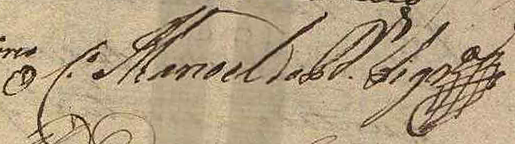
o C.o Manoel do D.s Figr.a
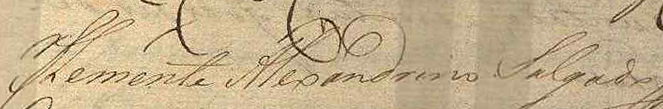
Clemente Alexandrino Salgado
